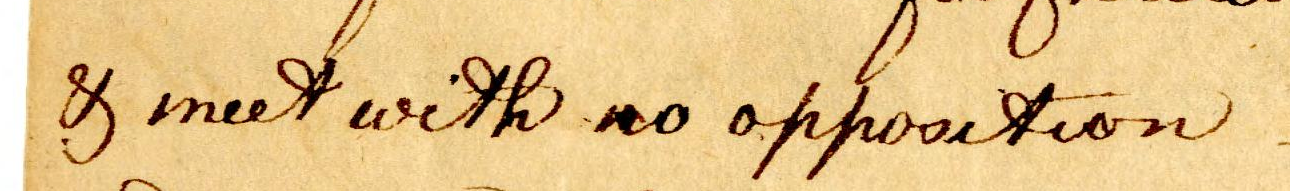& meet with no opposition
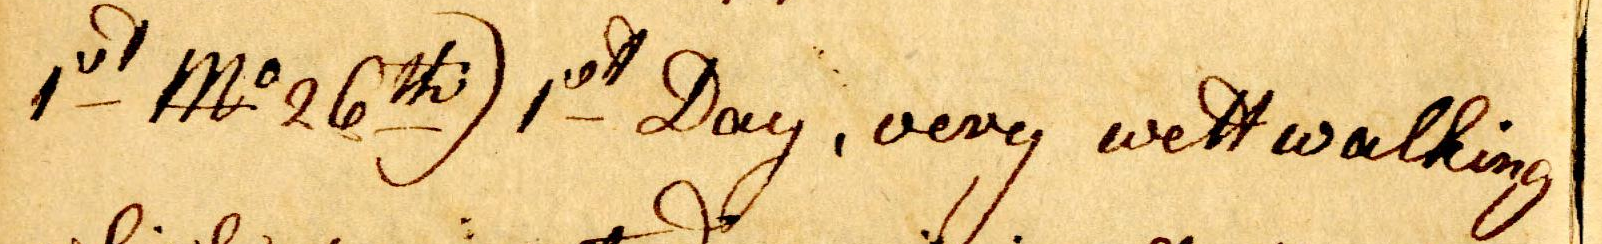1^st M^o 26^th) 1^st Day, very wett walking
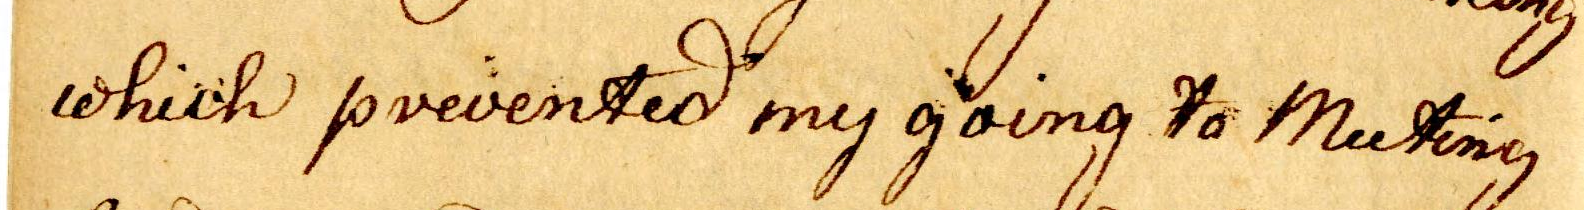which prevented my going to Meeting
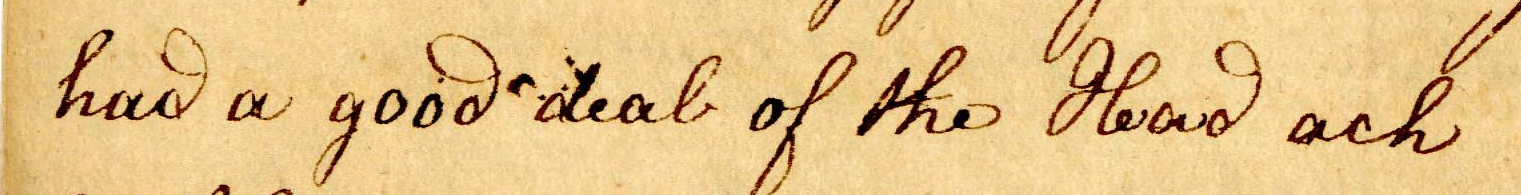had a good deal of the Head ach
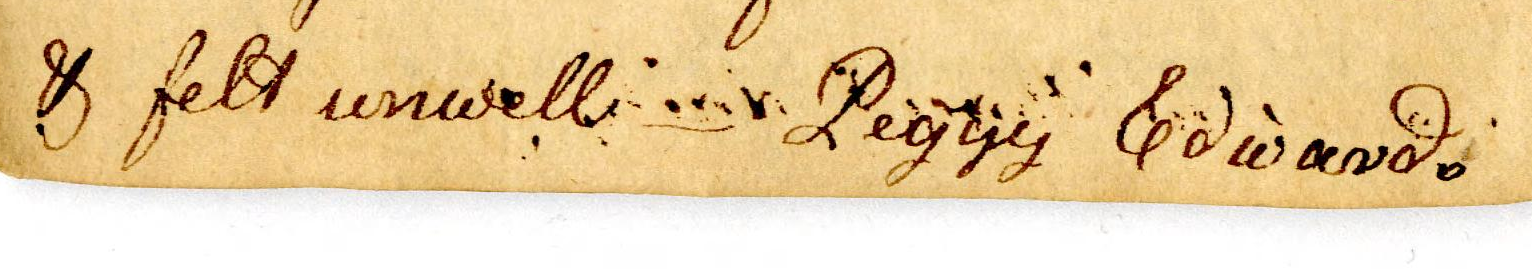& felt unwell- Peggy Edwards
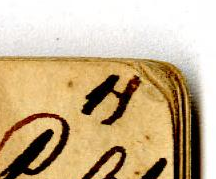11
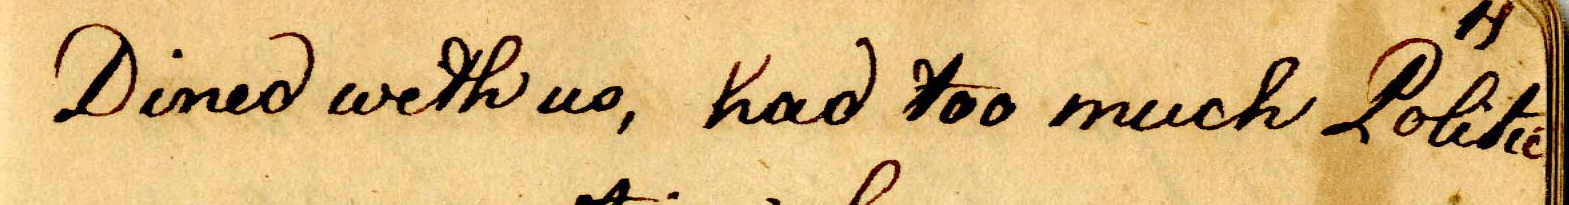Dined with us, had too much Polite
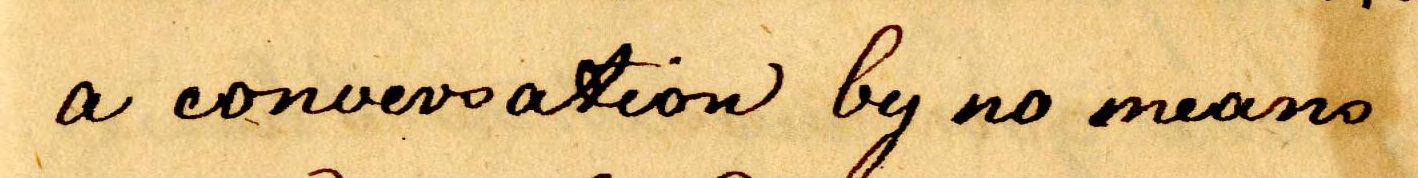a conversation by no means
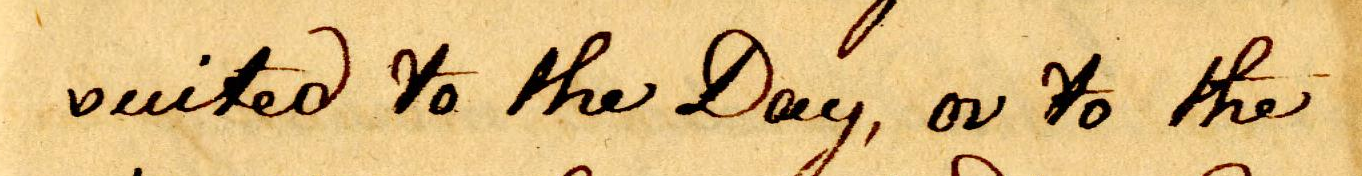suited to the Day, or to the
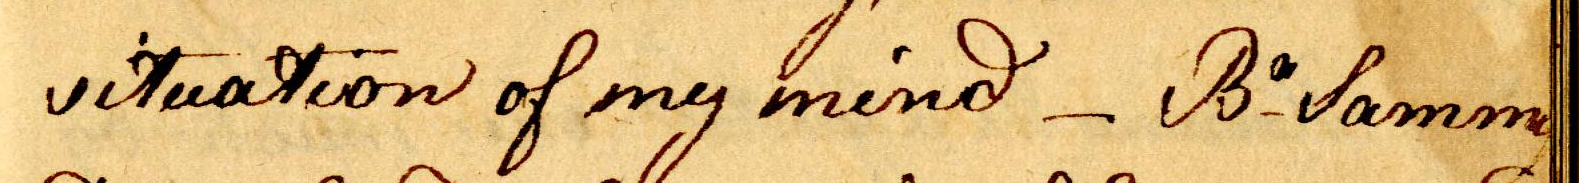situation of my mind- B^r Sammy
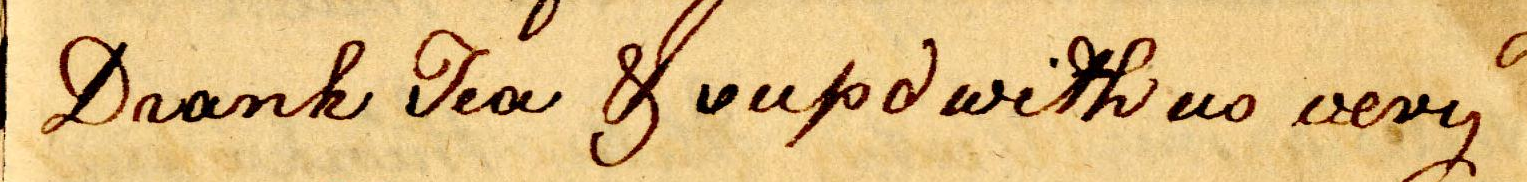Drank Tea & supd with us very
